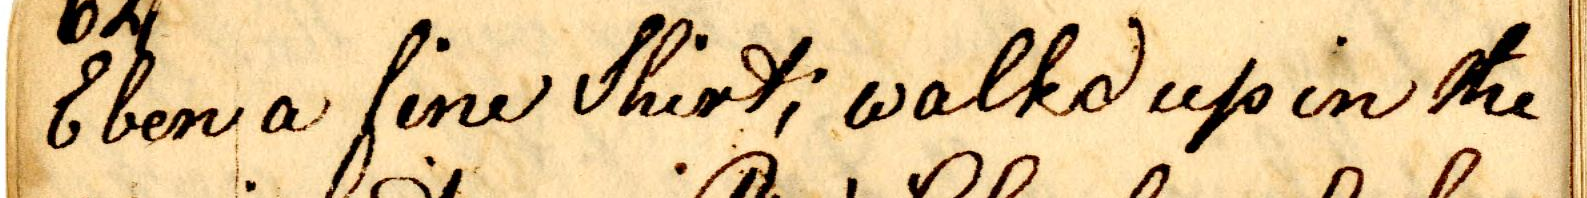Eben a fine Shirt, walkd up in the
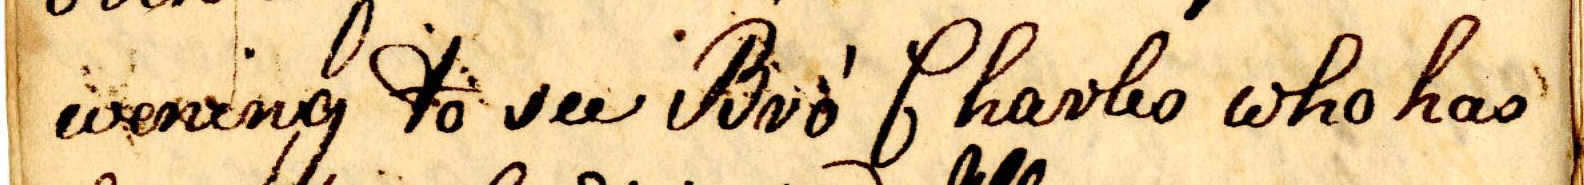evening to see Bro' Charles who has
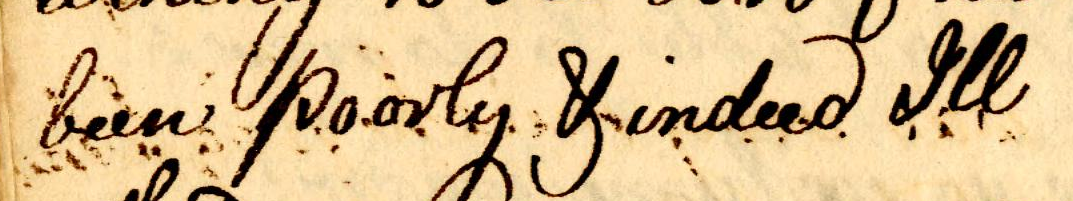been poorly & indeed Ill
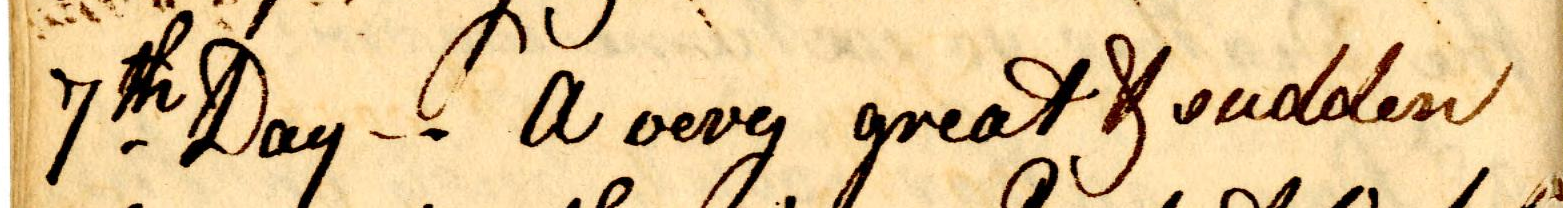7^th Day- A very great & sudden
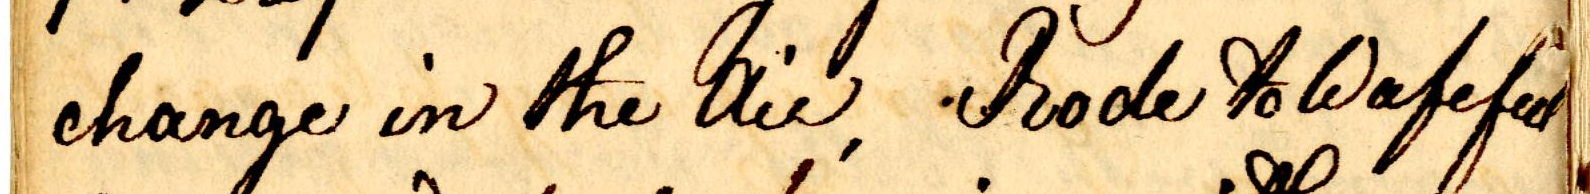change in the Air, Rode to Wafefeel
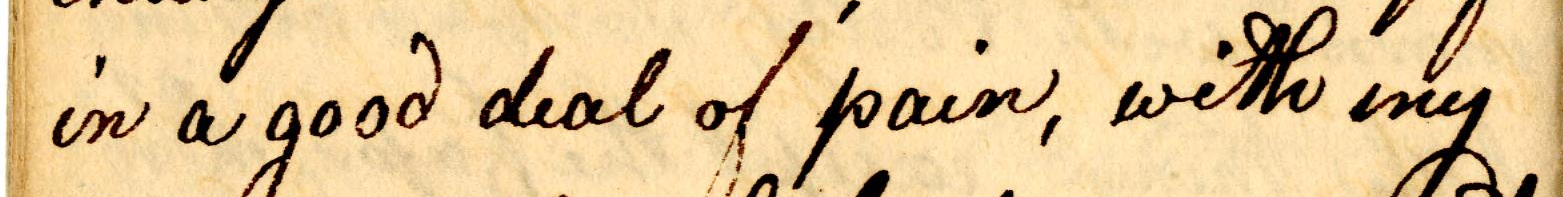in a good deal of pain, with my
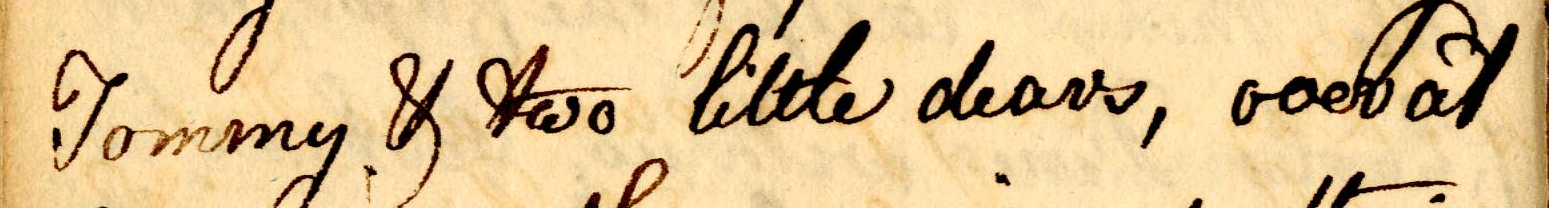Tommy & two little dears, over at
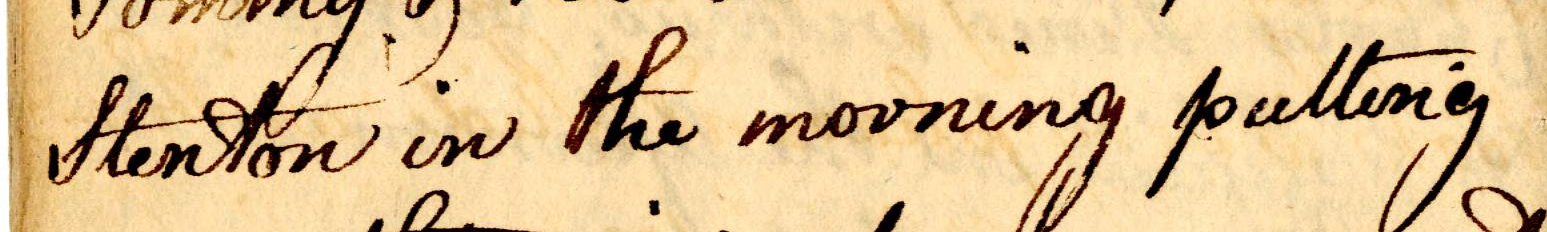Stenton in the morning putting
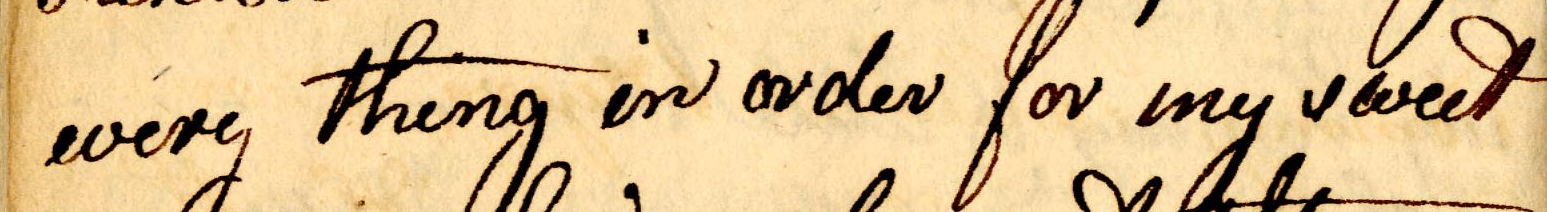every thing in order for my sweet
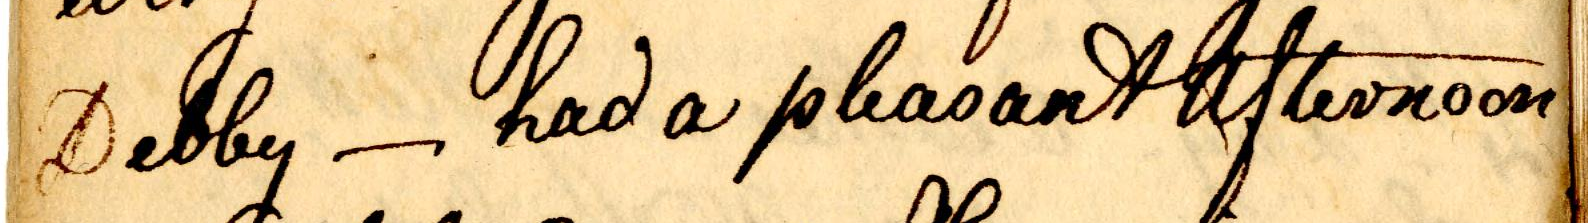Debby- had a pleasant Afternoon
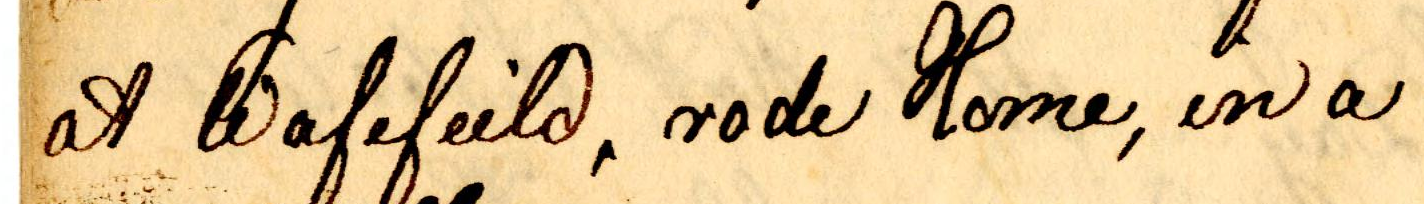at Wafefeild, rode Home, in a
